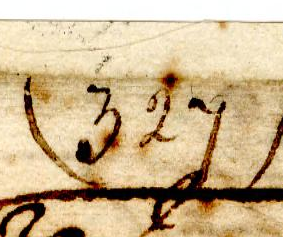327
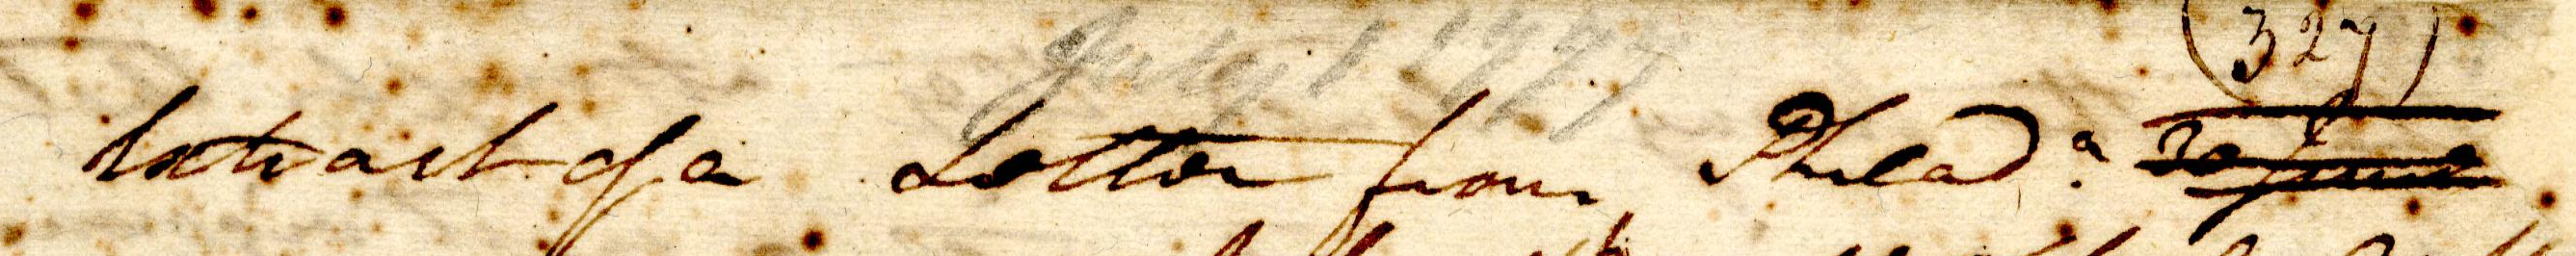Extract of a Letter from Philad^a [____]
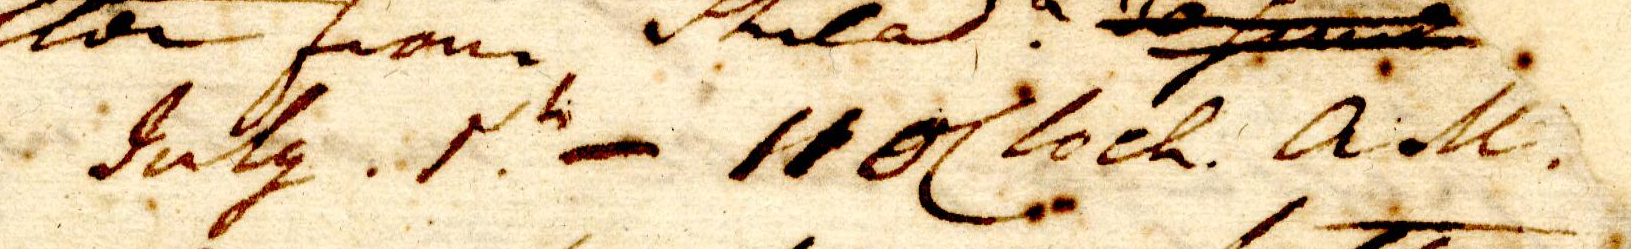July. 1^h.- 11 O'Clock AM
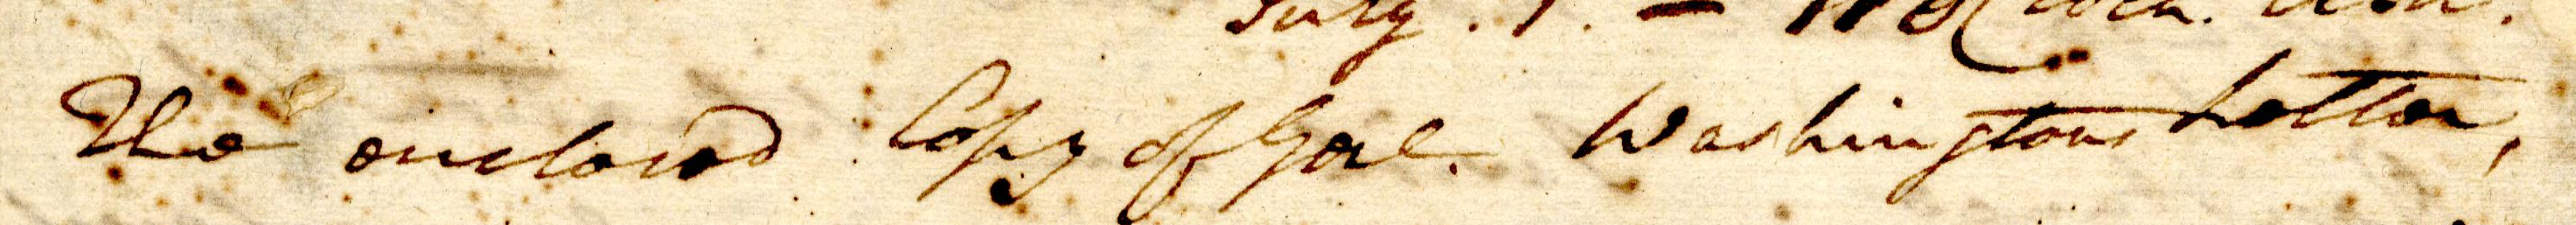The enclosd Copy of Genl. Washingtons Letter,
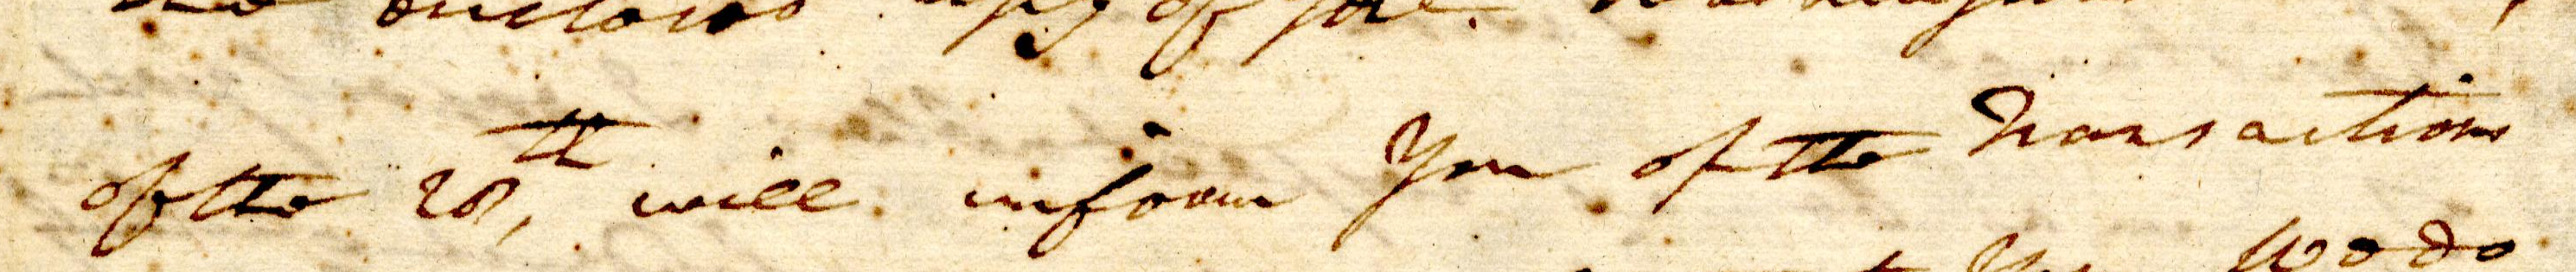of the 20^th will inform you of the transactions
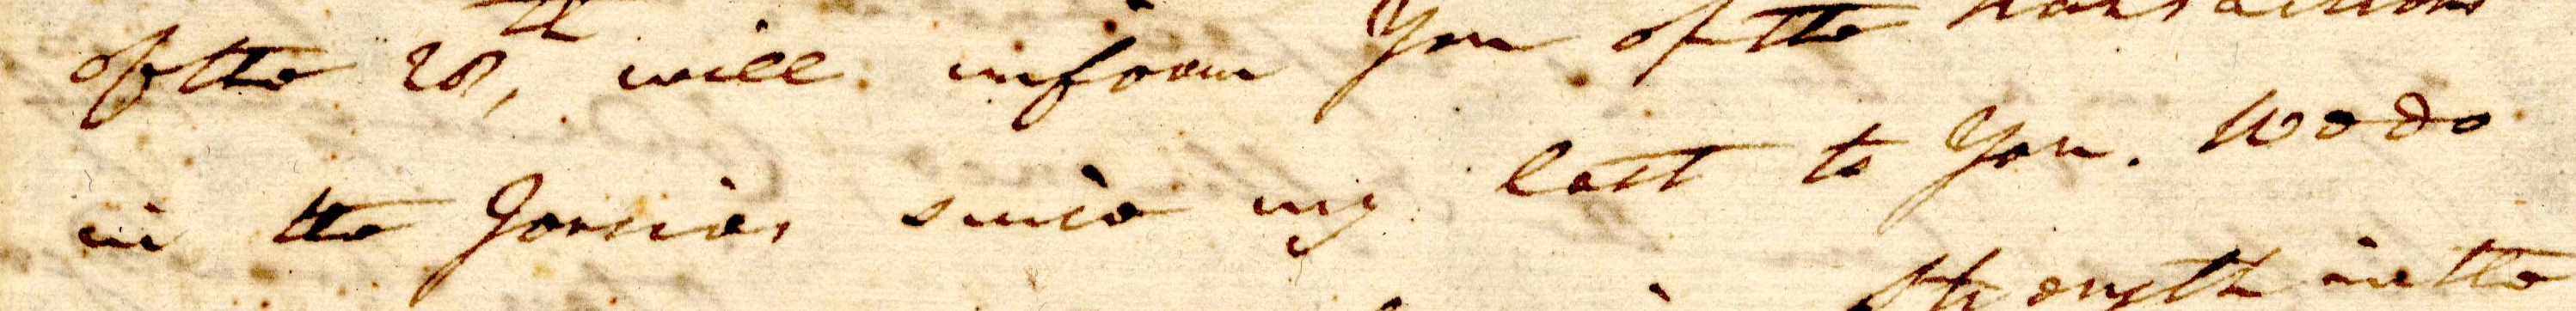in the Jersies since my last to you. We do
